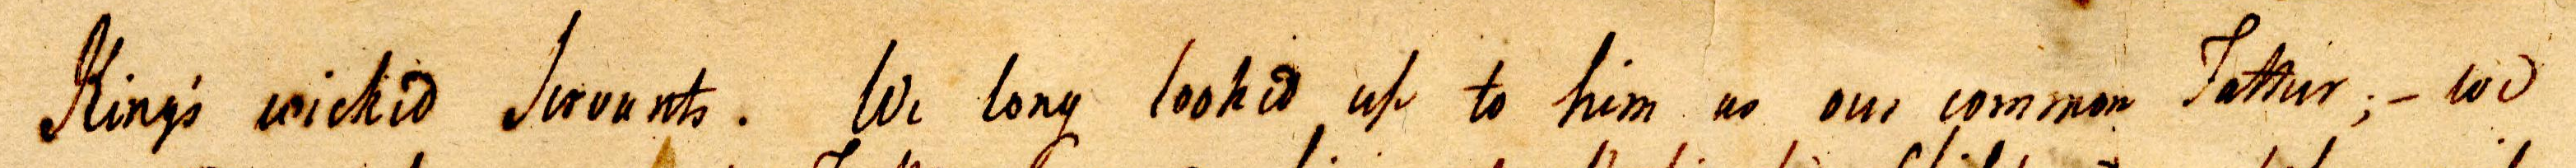King's wicked Servants. We long looked up to him as our common Father;- we
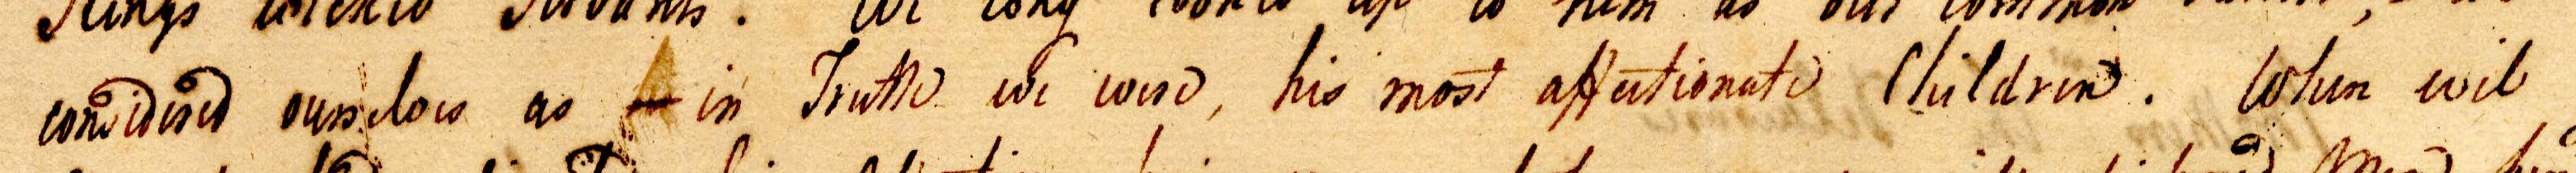considered ourselves as – in Truth we were, his most affectionate Children. When evil
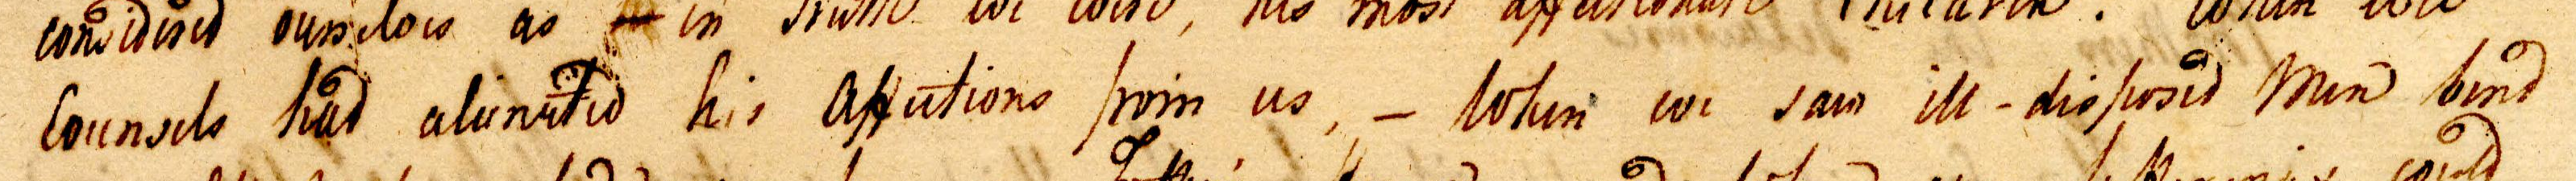Counsels had alienated his Affections from us,- When we saw ill-disposed Men bend
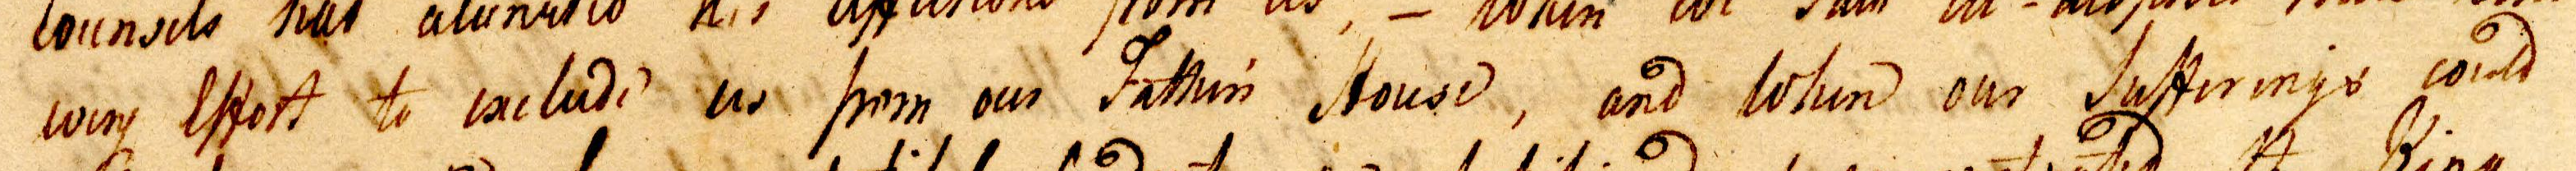every Effort to exclude us from our Father's House, and when our Sufferings could
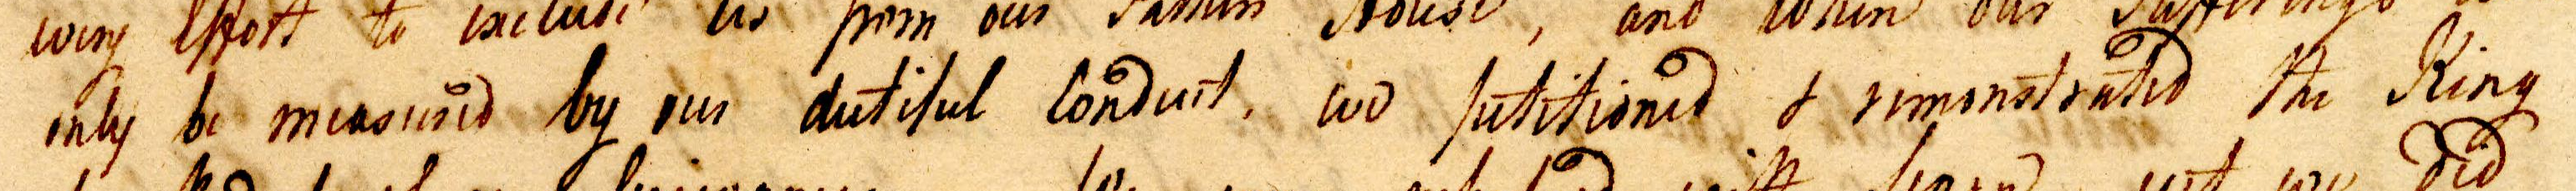only be measured by our dutiful Conduct, we petitioned & remonstrated the King
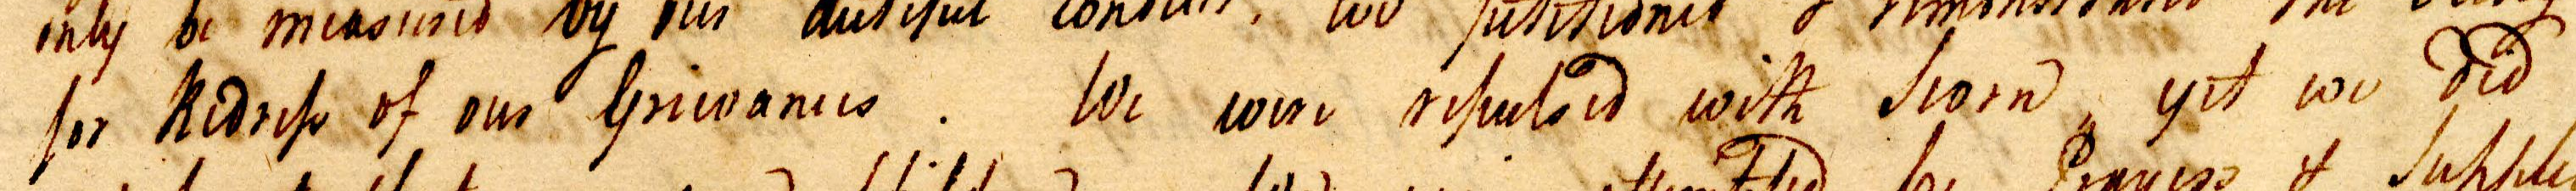for Redress of our Grievances. We were repulsed with Scorn yet we did
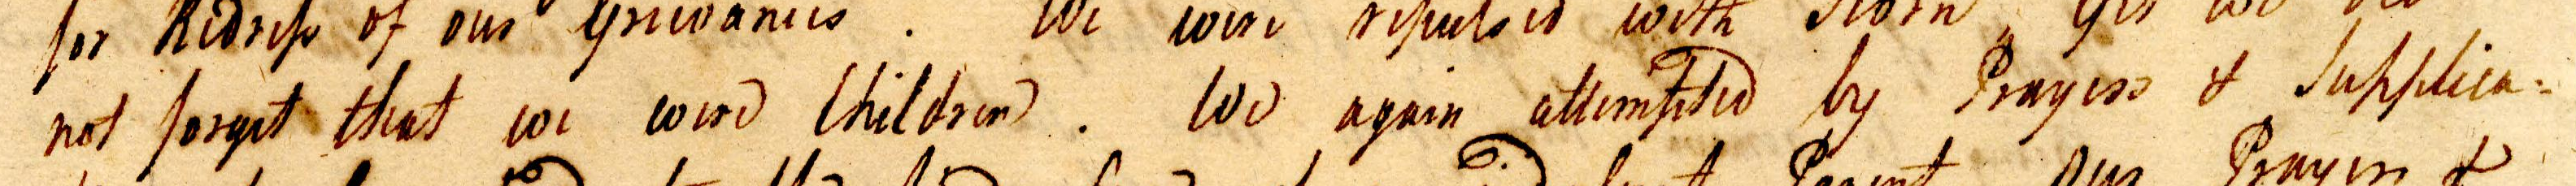not forget that we were Children. We again attempted by Prayers & Supplica-
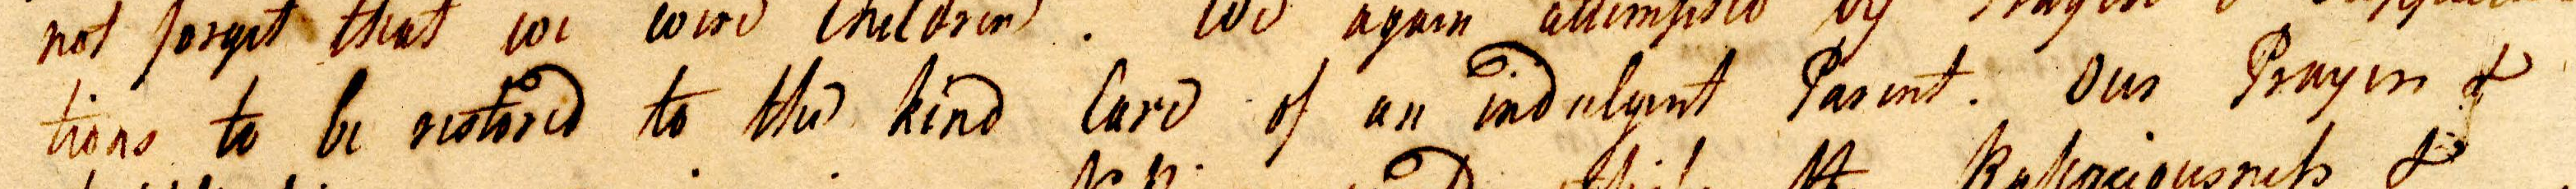tions to be restored to the kind Care of an indulgent Parent. Our Prayers &
